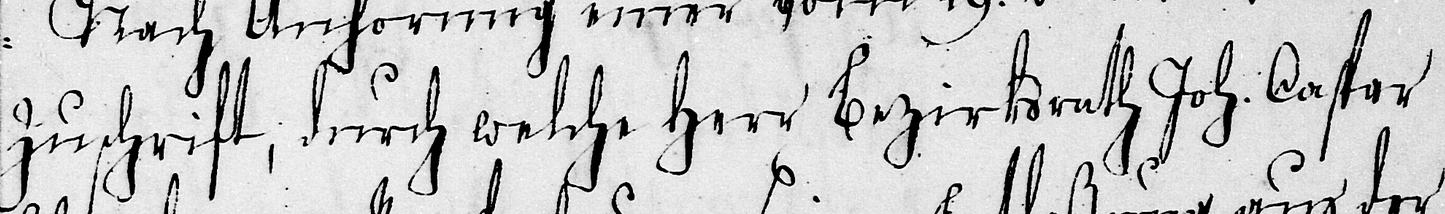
Zuschrift, durch welche Herr Bezirksrath Joh. Caspar
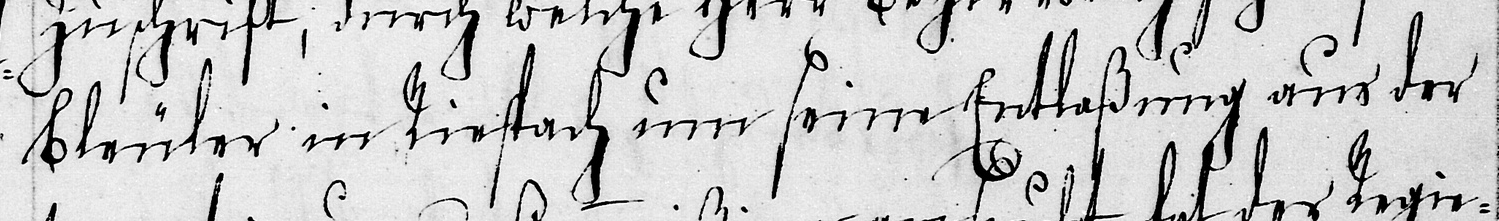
Bleuler in Riespach um seine Entlaßung aus der
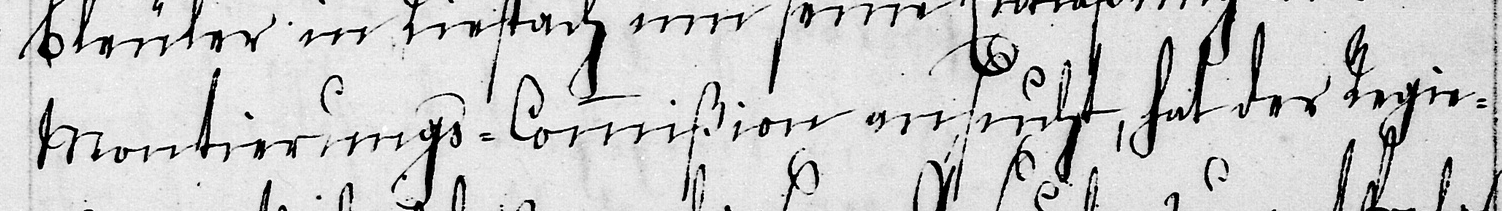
Montierungs-Commißion ansucht, hat der Regie¬
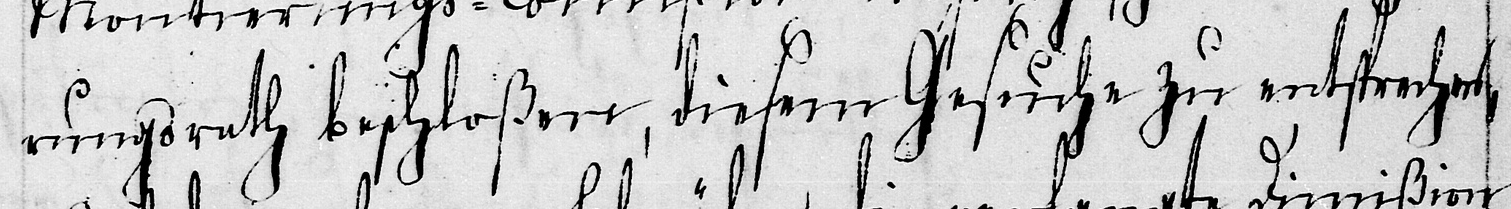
rungsrath beschloßen, diesem Gesuche zu entspreche¬
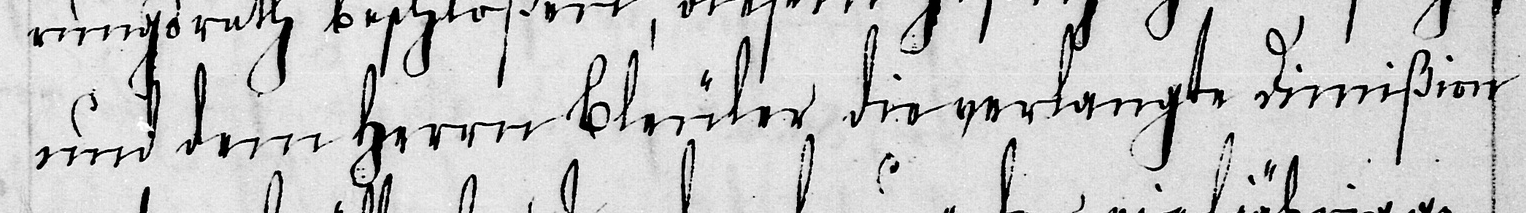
und dem Herrn Bleuler die verlangte Dimißion
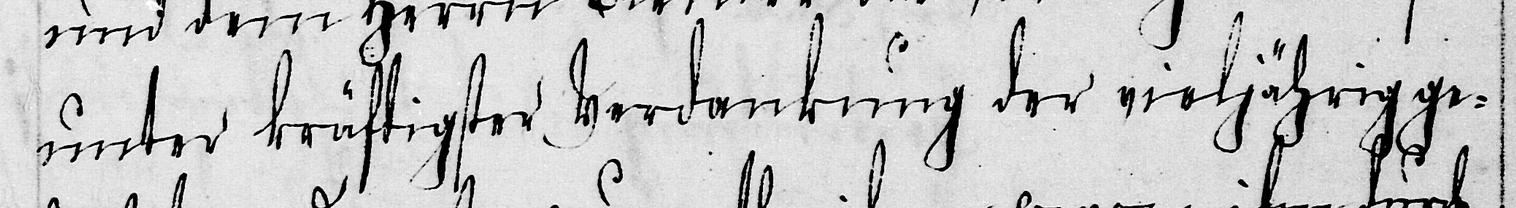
unter kräftigster Verdankung der vieljährig ge¬
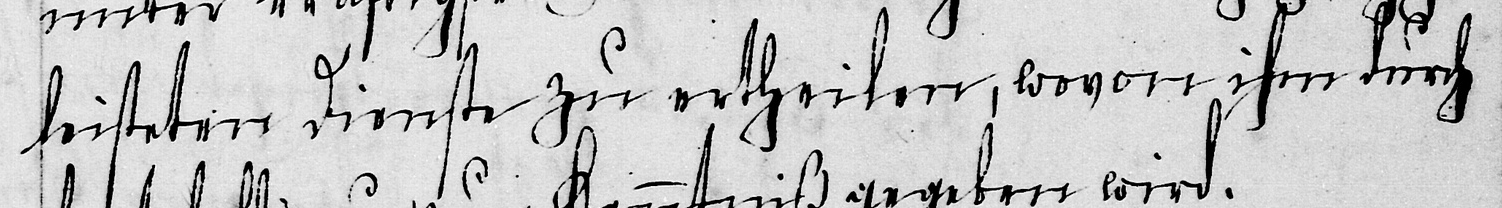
leisteten Dienste zu ertheilen, wovon ihm durch
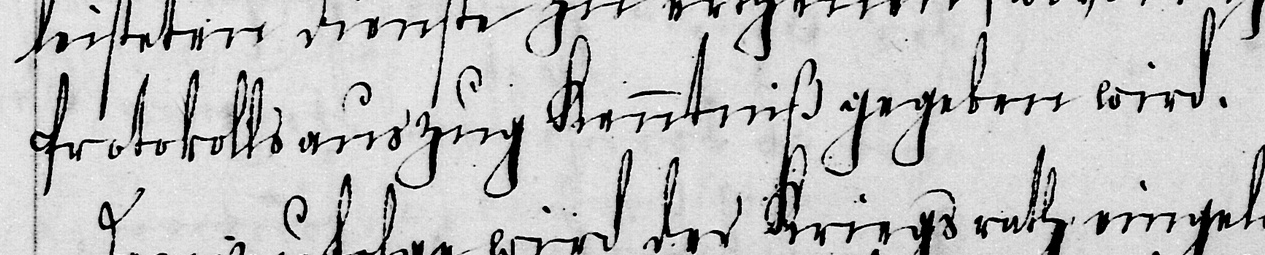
Protokollsauszug Kenntniß gegeben wird.
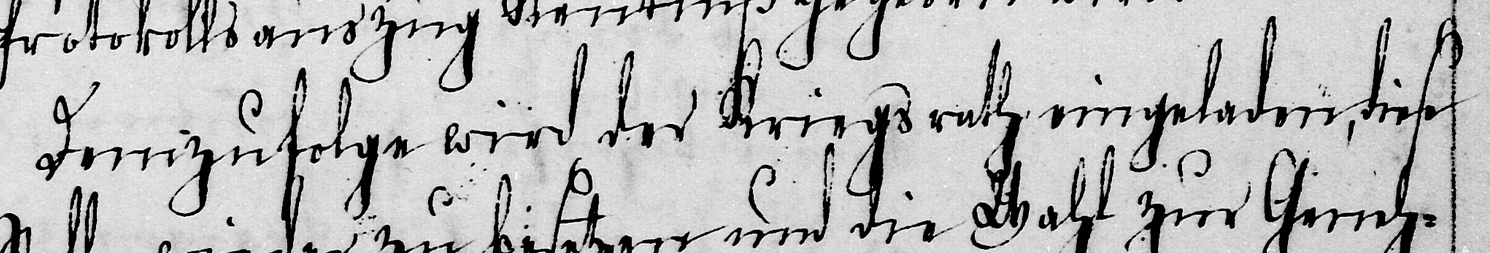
Demzufolge wird der Kriegsrath eingeladen, diese
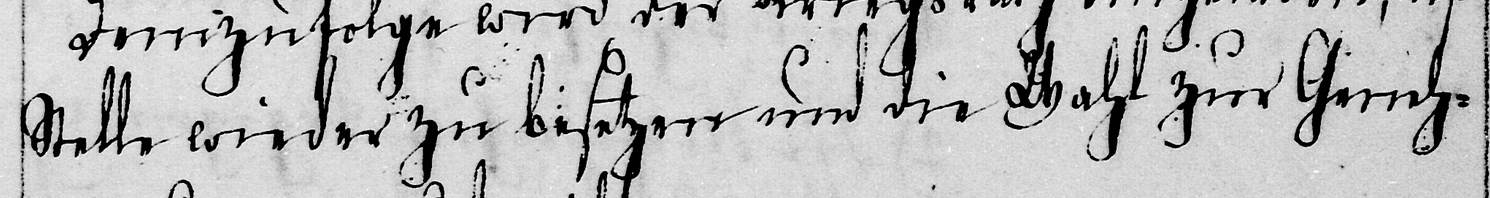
Stelle wieder zu besetzen und die Wahl zur Geneh¬
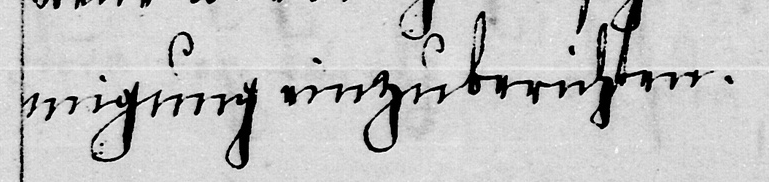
migung einzuberichten.
